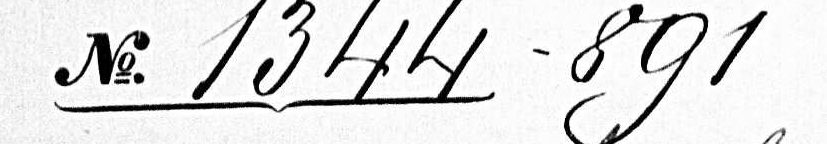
No 1344– 1891
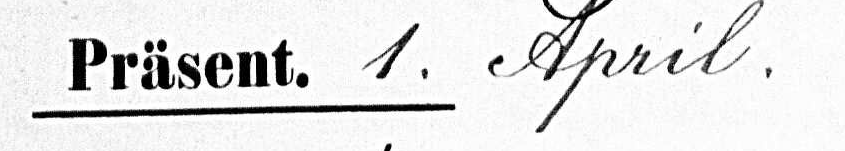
Präsent. – 1. April
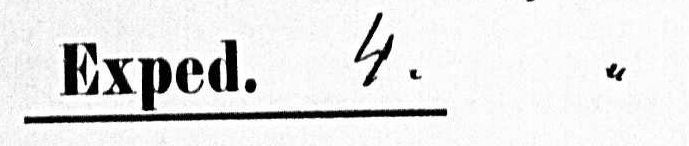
Exped. – 4. April
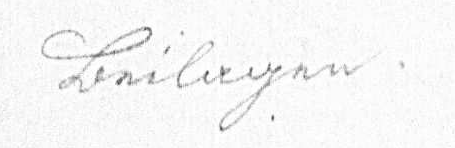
Beilagen
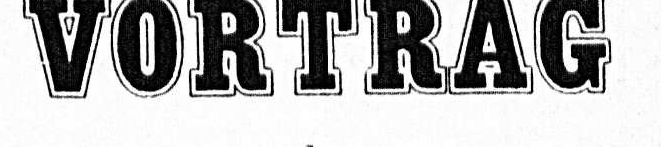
VORTRAG
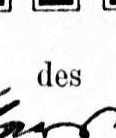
des
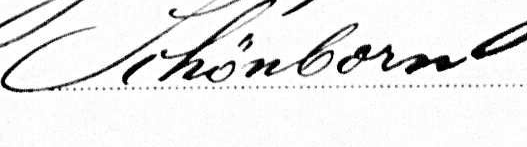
Schönborn
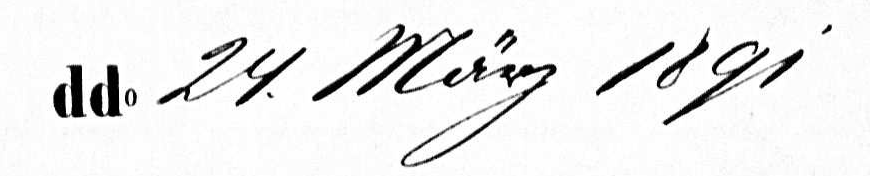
Ddo 24. März 1891
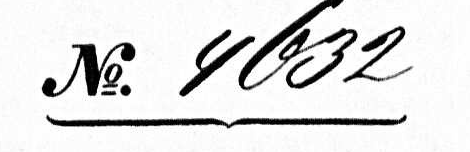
No. 4632
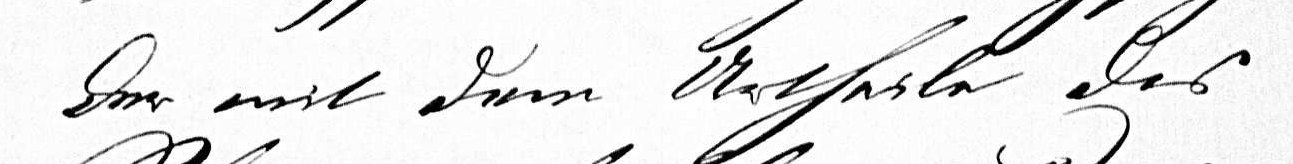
der mit dem Urtheile des
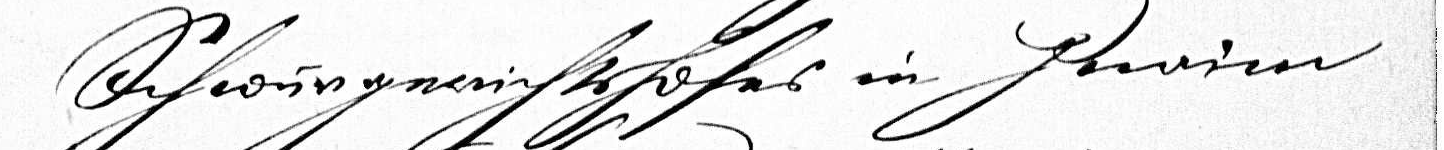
Schwurgerichtshofes in Graim
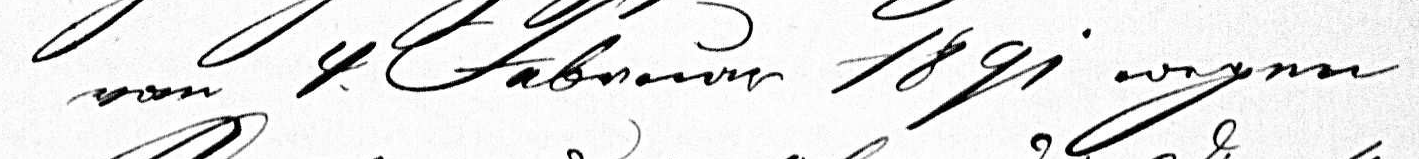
vom 4. Februar 1891 wegen
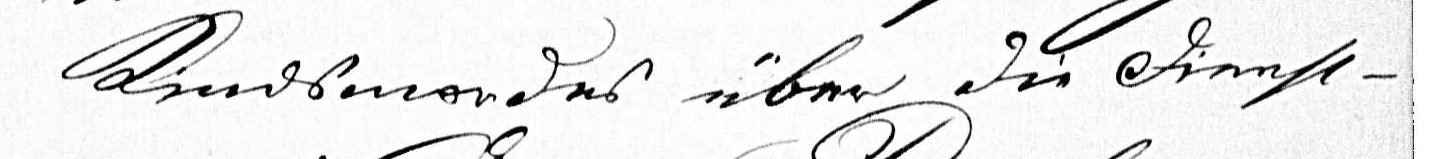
Kindesmordes über die Dienst¬
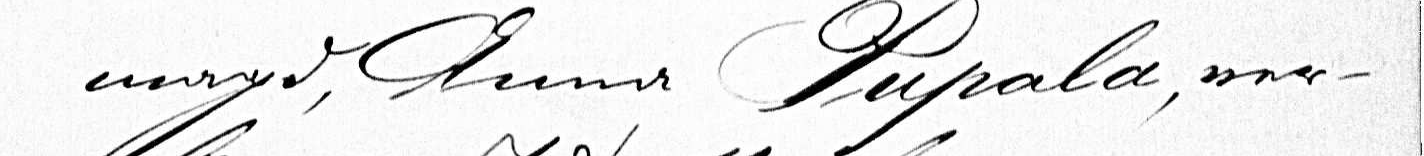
magd, Anna Pupala, ver¬
